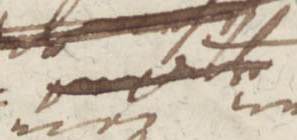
oder Säulen
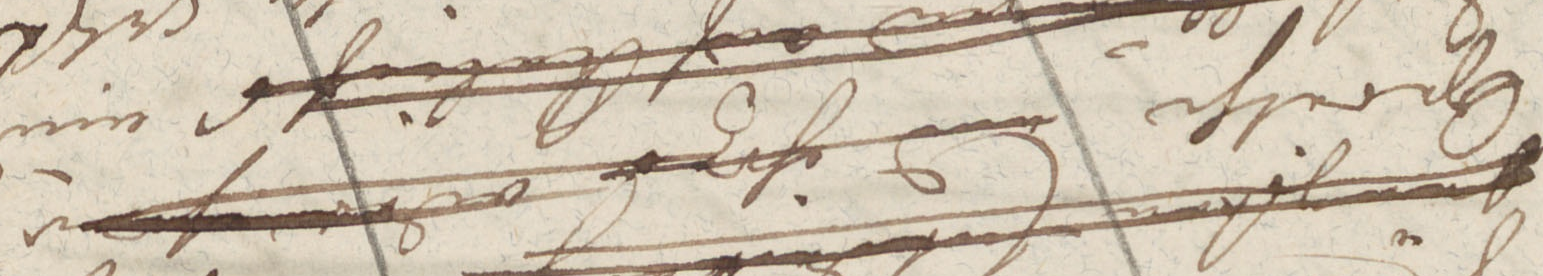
Vorstellungen sich mir uber ihre
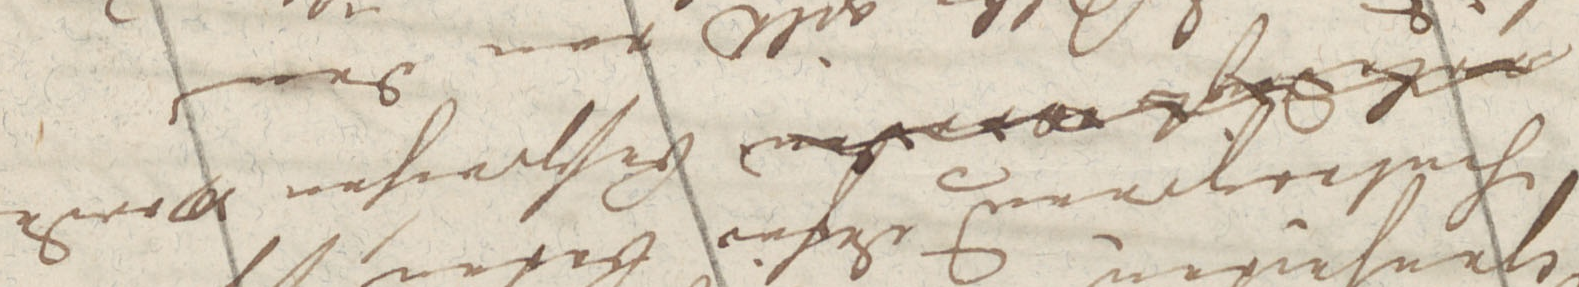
oder führen doch doch auf Bemerkungen
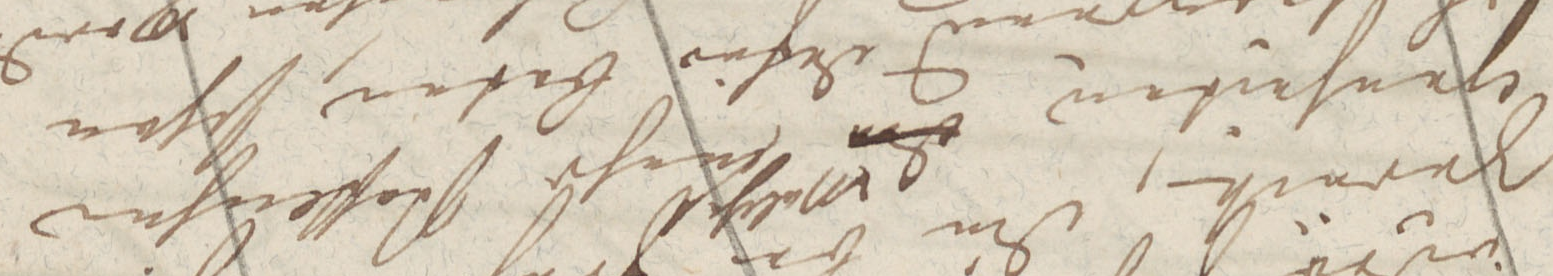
genheiten die welche mehr stofflichen
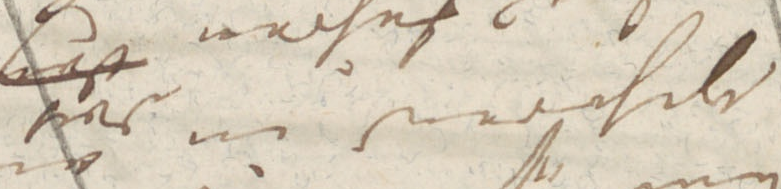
sind. Dasselbe
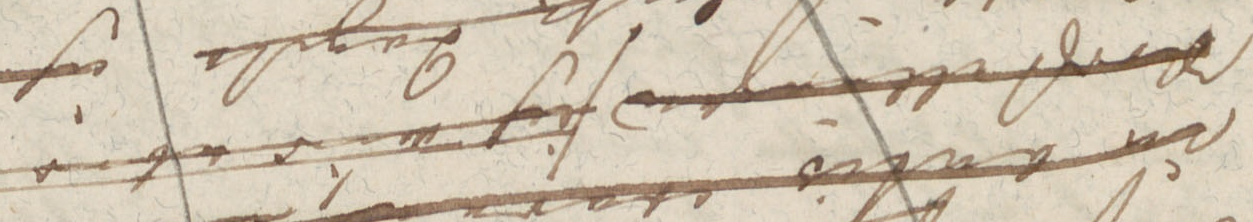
% Geräthe und ihrer oder ihrer
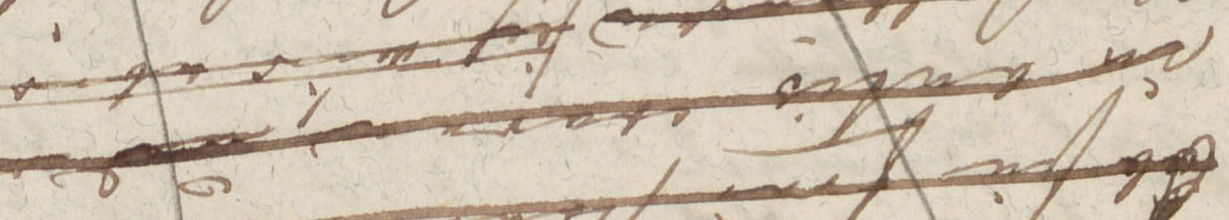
Darstellungen auf Reliefs und
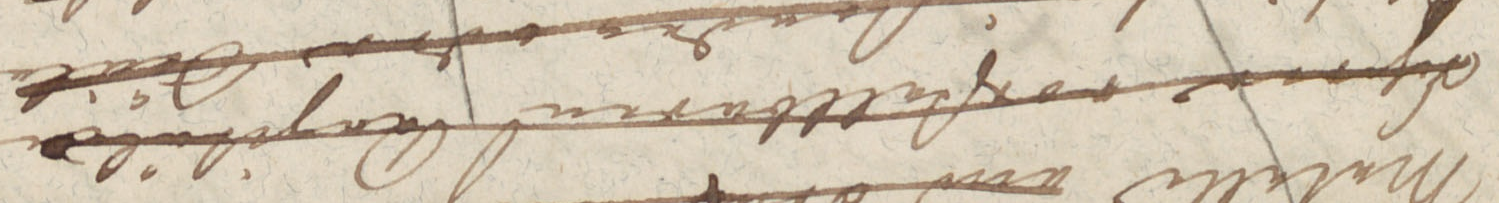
kennen, uns schon gestatte sie gestat % %
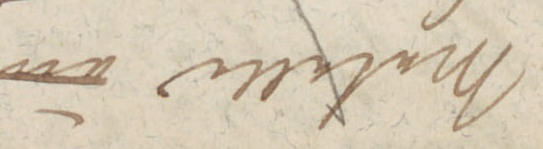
ietwas konkreterer Weise
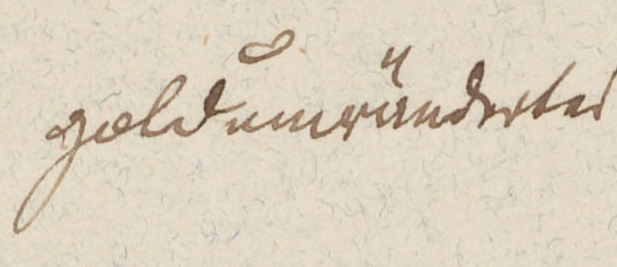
% und Phönikischen
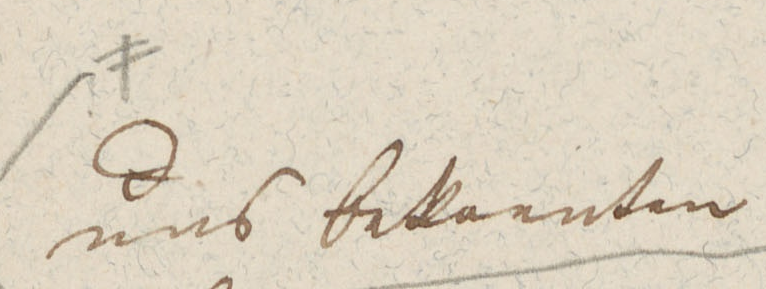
% uns gestatten
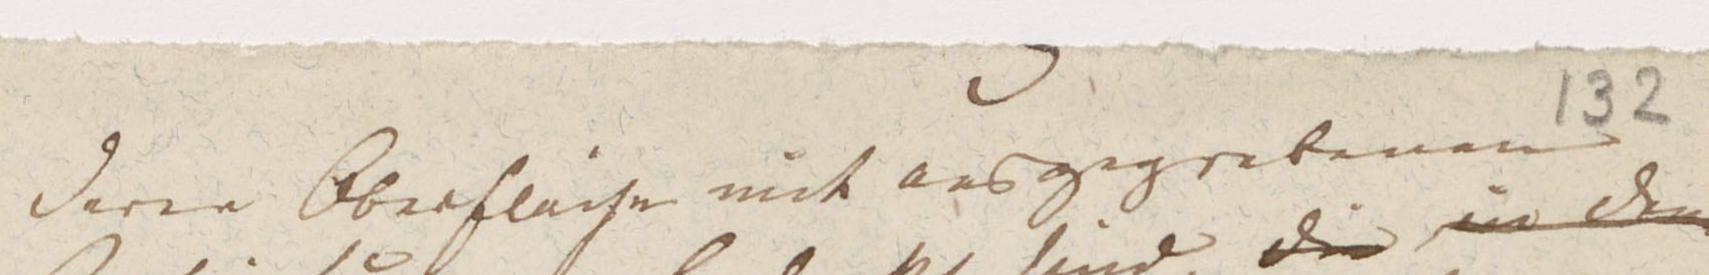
deren Oberfläche mit ausgegrabenen
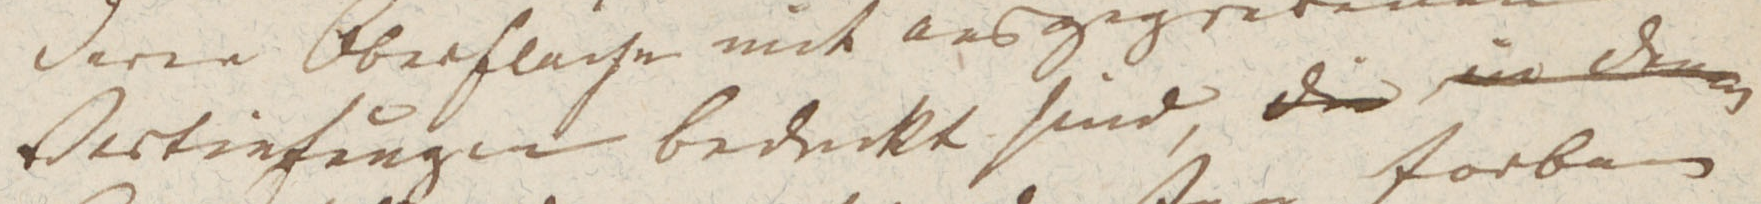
Vertiefungen bedeckt sind, die in denen
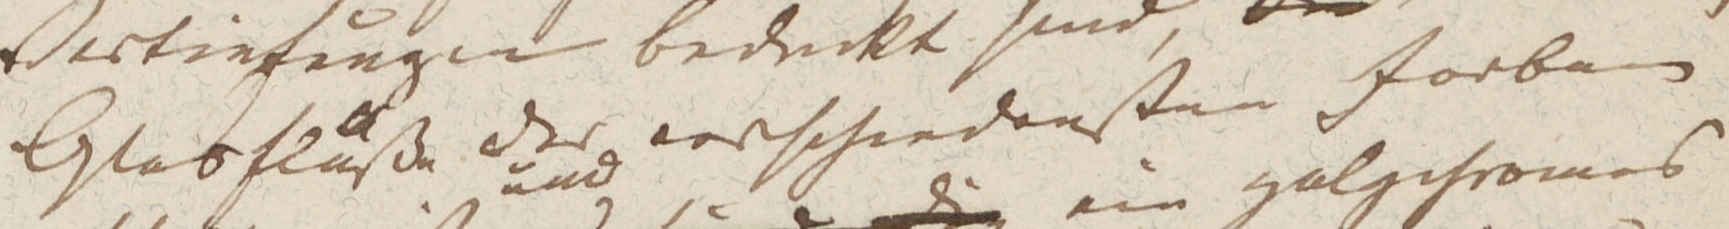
Glasfluüsse der verschiedensten Farben
